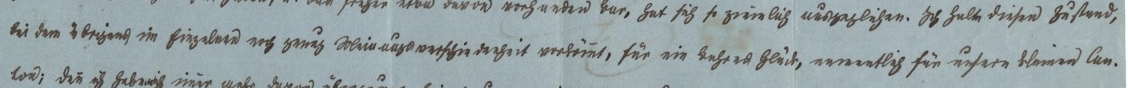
bei dem übrigens im Einzelnen noch Meinungsverschiedenheit vorkömmt, für ein wahres Glück, namentlich für unsern kleinen Can-
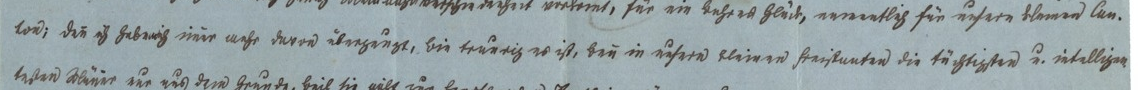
ton; denn ich habe mich immer mehr davon überzeugt, wie traurig es ist, wenn in unsern kleinen Freistaaten die tüchtigsten u. intelligen-
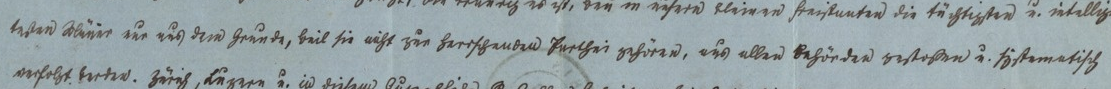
testen Männer nur aus dem Grunde, weil sie nicht zur herrschenden Parthei gehören, aus allen Behörden gestoßen u. systematisch
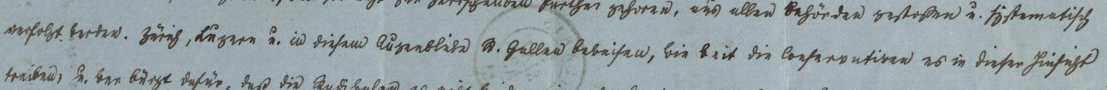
verfolgt werden. Zürich, Luzern u. in diesem Augenblicke St. Gallen beweisen, wie weit die Conservativen es in dieser Hinsicht
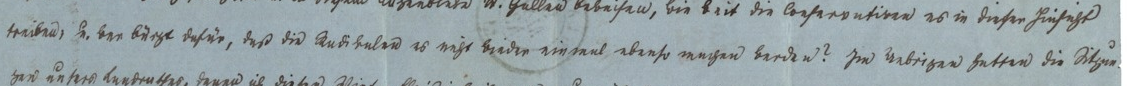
treiben, u. wer bürgt dafür, daß die Radikalen es nicht wieder einmal ebenso machen werden? Im Uebrigen hatten die Sitzun-
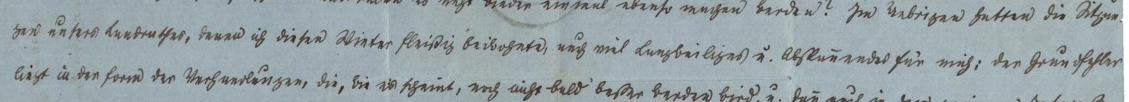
gen unsers Landrathes, denen ich diesen Winter fleißig beiwohnte, auch viel Langweiliges u. Abspannendes für mich; der Grundfehler
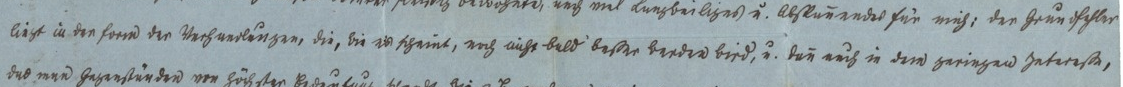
liegt in der Form der Verhandlungen, die, wie es scheint, noch nicht bald besser werden wird, u. dann auch in dem geringen Interesse,
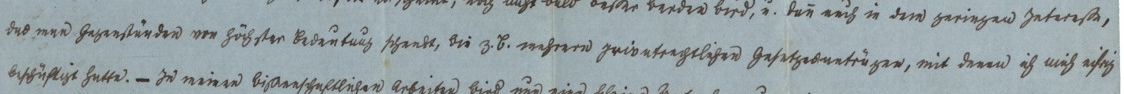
das man Gegenständen von höchster Bedeutung schenkt, wie z. B. mehrern privatrechtlichen Gesetzesanträgen, mit denen ich mich eifrig
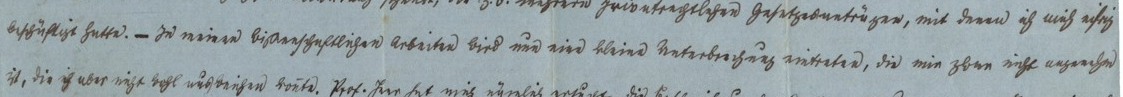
beschäftigt hatte. – In meinen wissenschaftlichen Arbeiten wird nun eine kleine Unterbrechung eintreten, die mir zwar nicht angenehm
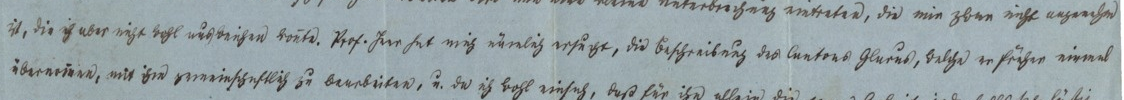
ist, die ich aber nicht wohl ausweichen konnte. Prof. Heer hat mich nämlich ersucht, die Beschreibung des Cantons Glarus, welche er früher einmal
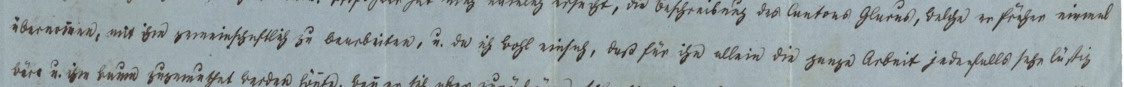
übernommen, mit ihm gemeinschaftlich zu bearbeiten, u. da ich wohl einsah, daß für ihn allein die ganze Arbeit jedenfalls sehr lästig
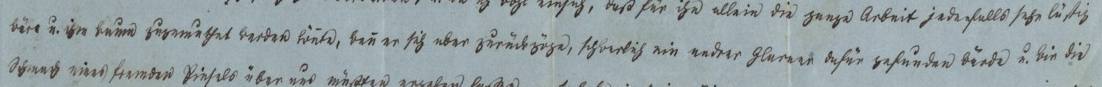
wäre u. ihm kaum zugemuthtet werden könnte, wenn er sich aber zurückzöge, schwerlich ein andrer Glarner dafür gefunden würde u. wir die
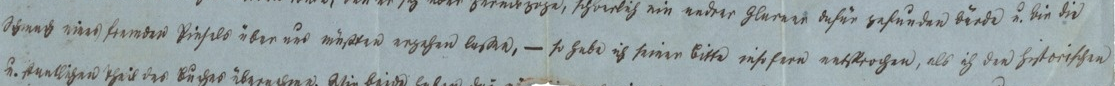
Schmach eines fremden Pinsels über uns müßten ergehen lassen, – so habe ich seiner Bitte insofern entsprochen, als ich den historischen
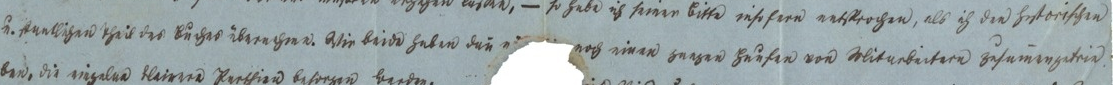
u. staatlichen Theil des Buches übernehme. Wir beide haben dann nebenbei noch einen ganzen Haufen von Mitarbeitern zusammengetrie-
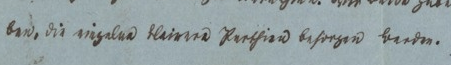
ben, die einzelne kleine Parthien besorgen werden.
